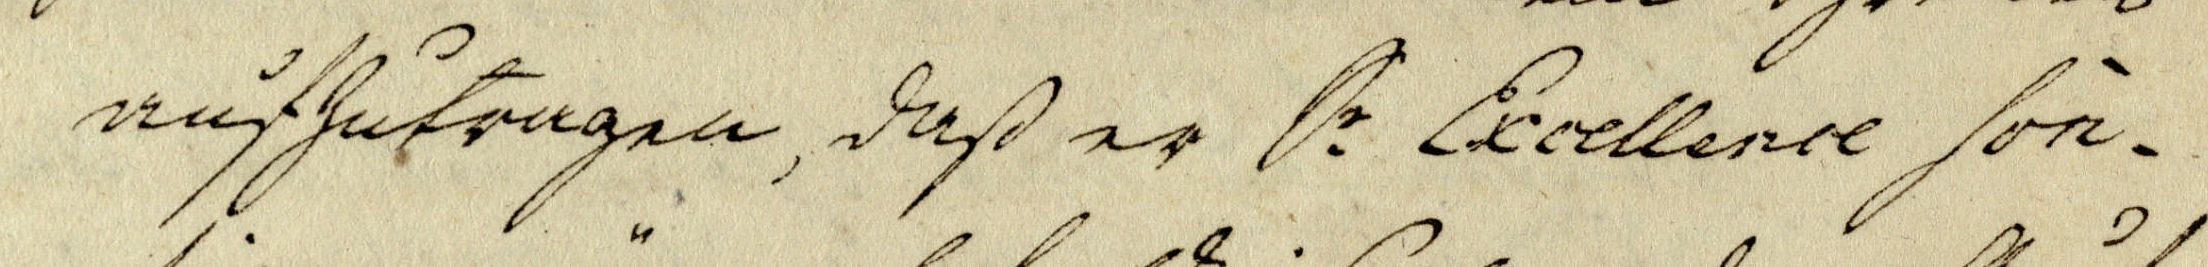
aufzutragen, daß er Sr Excellence son¬
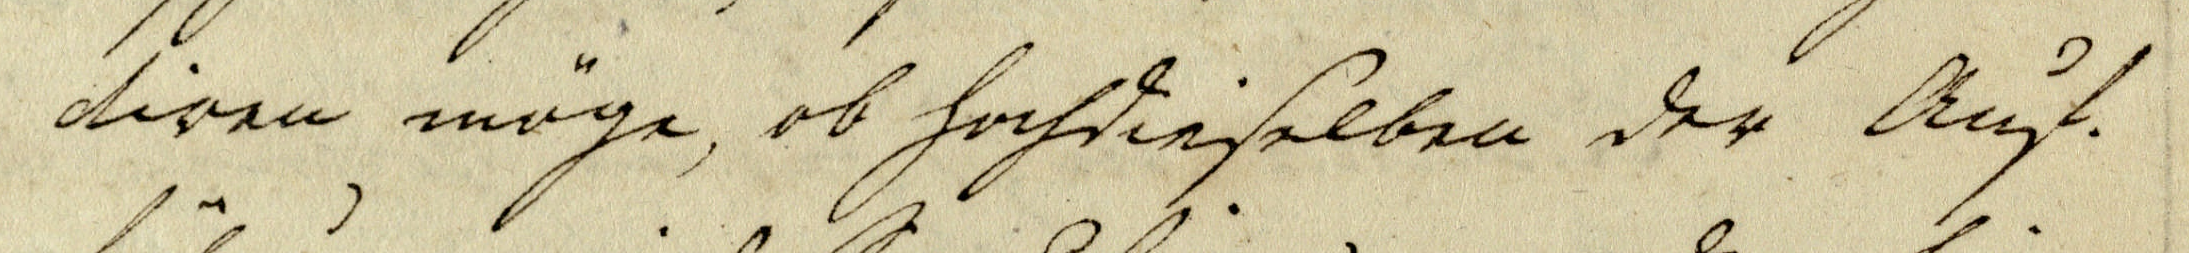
diren möge, ob Hochdieselben der Auf¬
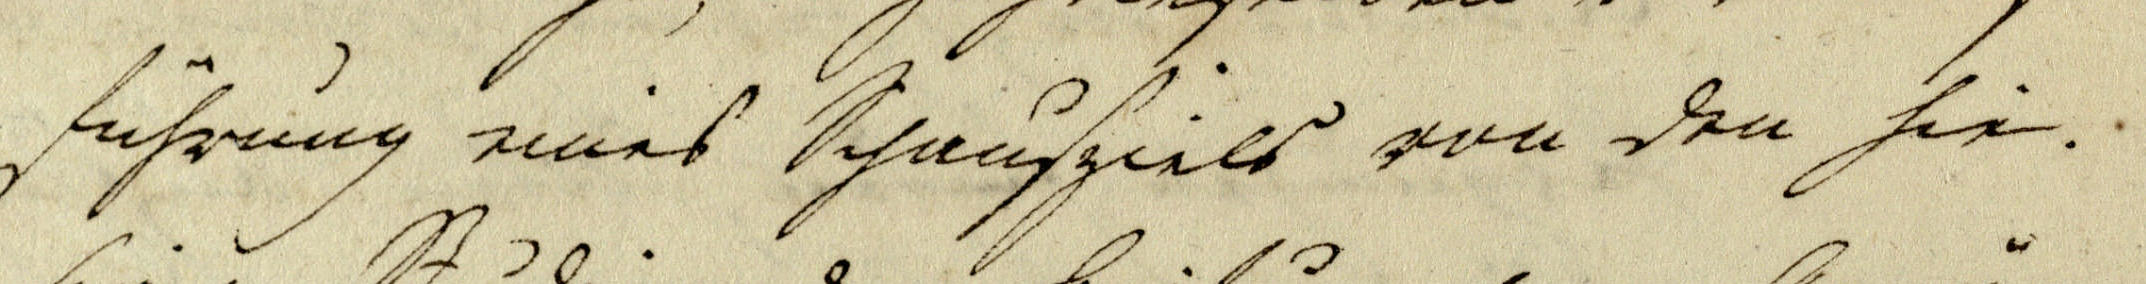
führung eines Schauspiels von den hie¬
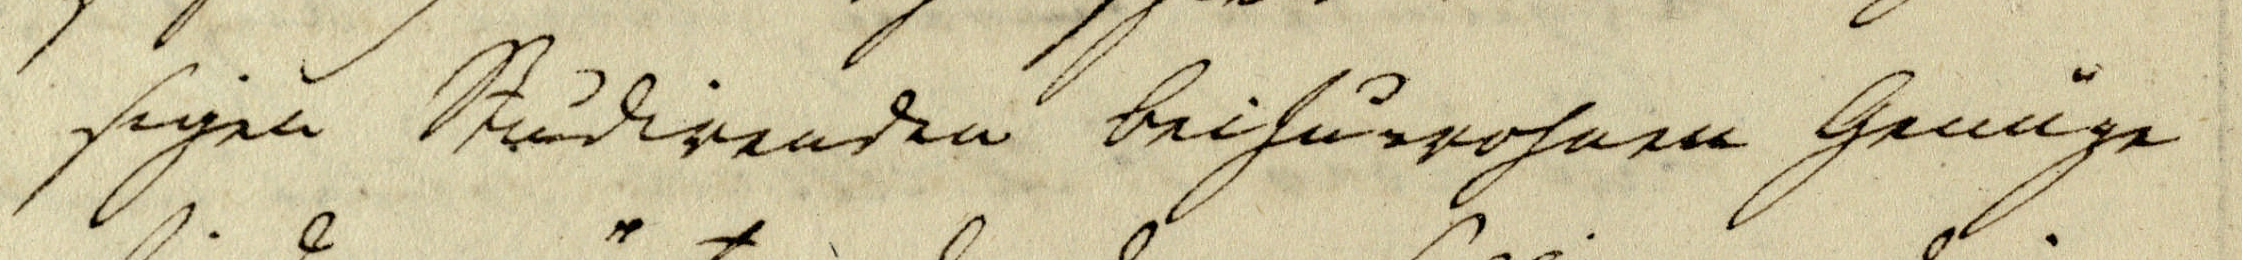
sigen Studirenden beizuwohnen Genüge
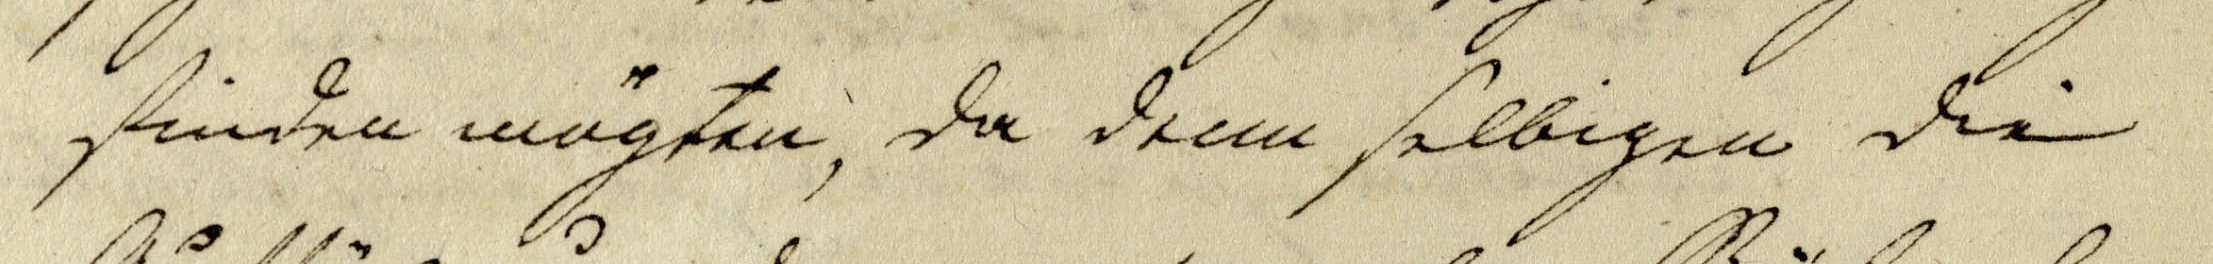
finden mögten, da denn selbigen die
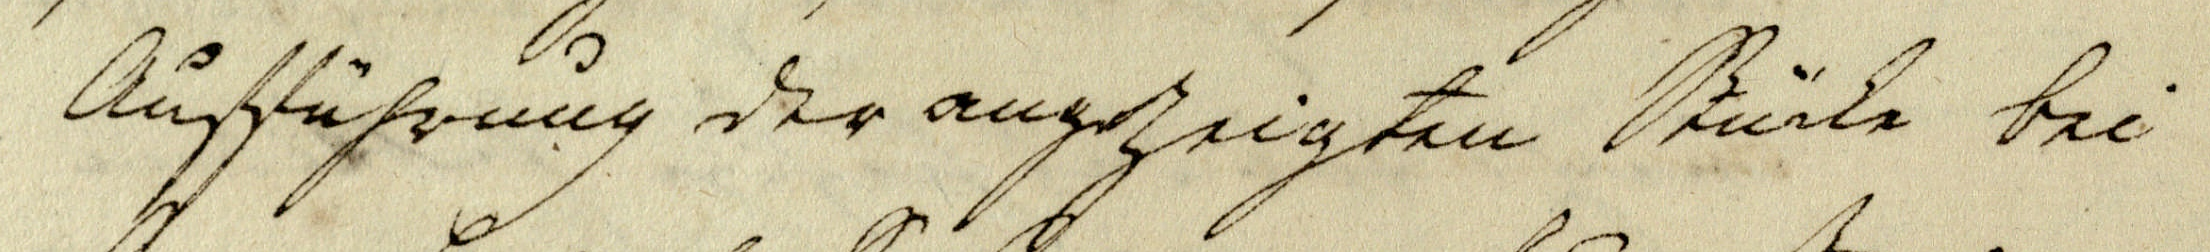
Aufführung der angezeigten Stücke bei
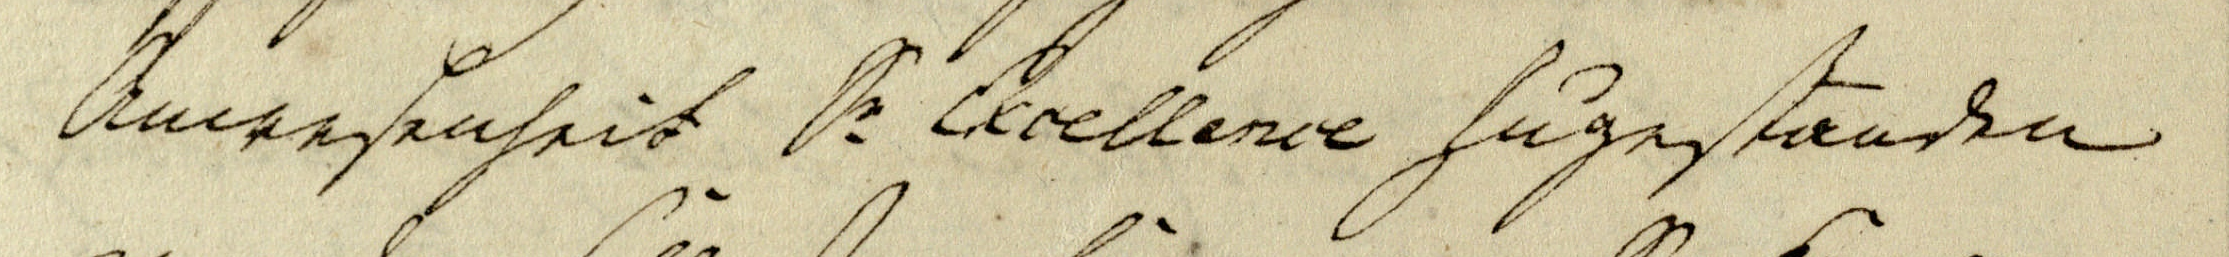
Anwesenheit Sr Excellence zugestanden
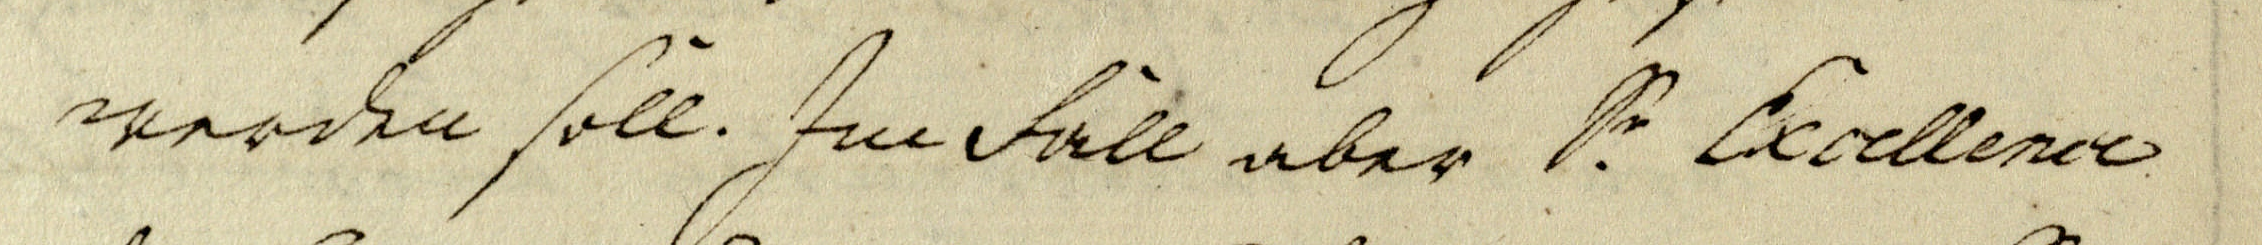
werden soll. Im Fall aber Sr Excellence
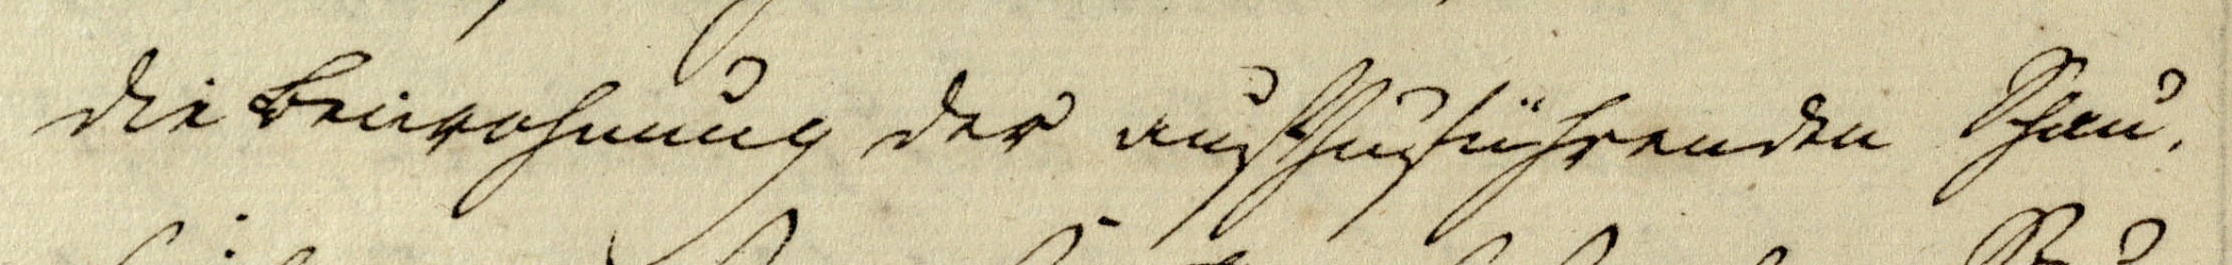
die Beiwohnung der aufzuführenden Schau¬
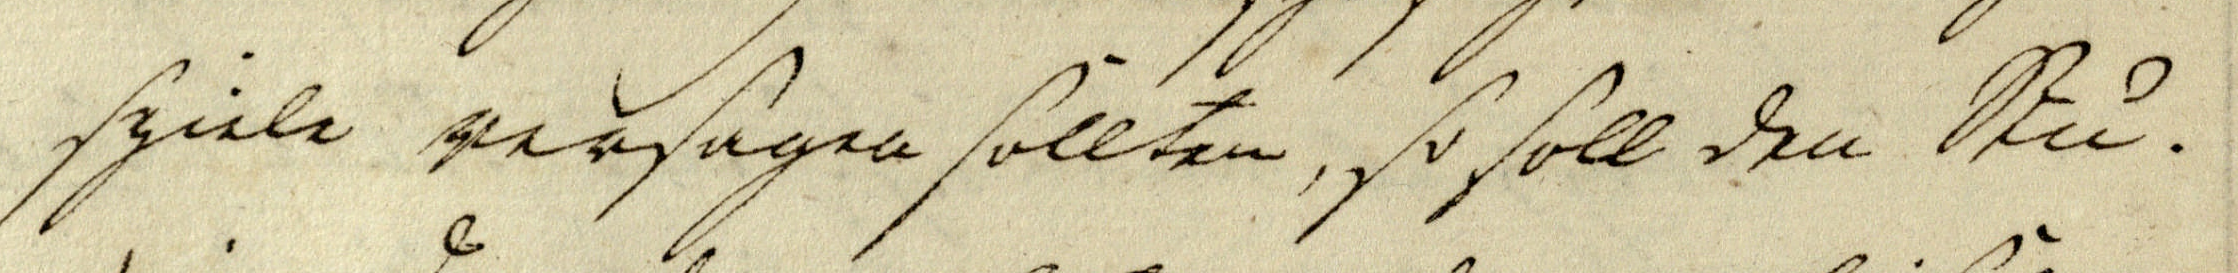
spiele versagen sollten, so soll den Stu¬
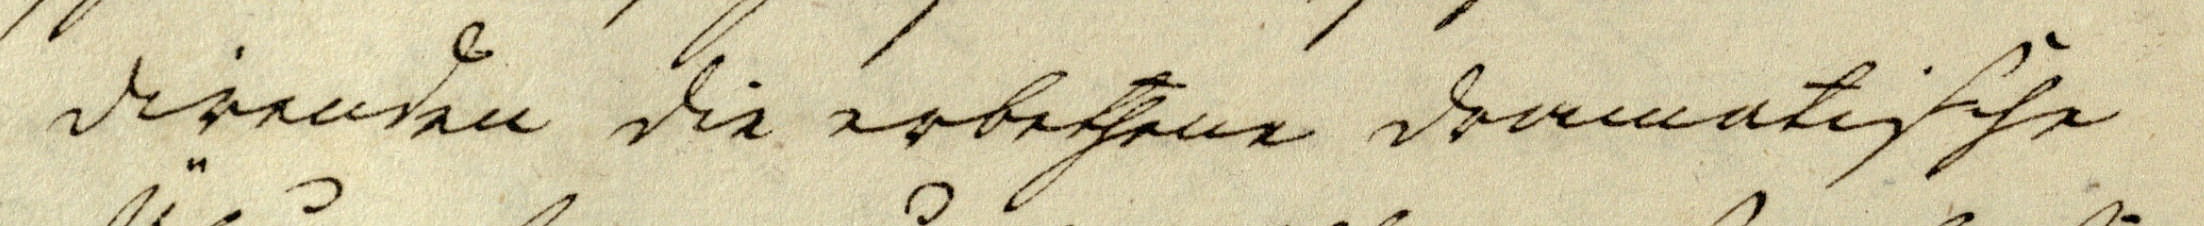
direnden die erbethene dramatische
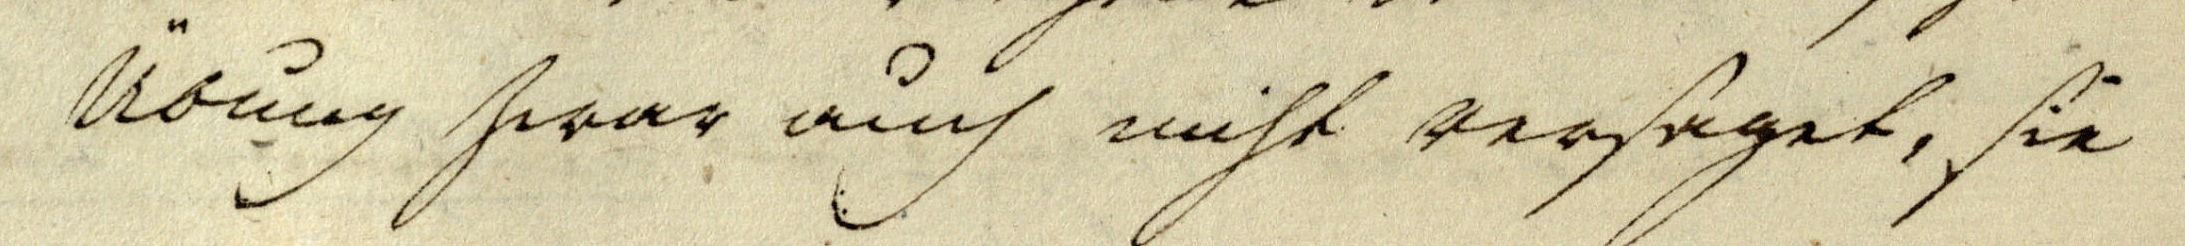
Übung zwar auch nicht versaget, sie
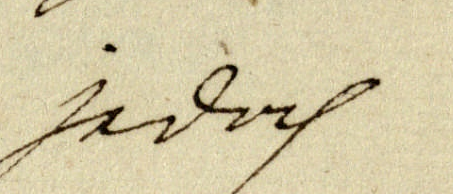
jedoch
